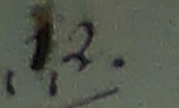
12.
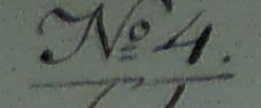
No͇ 4.
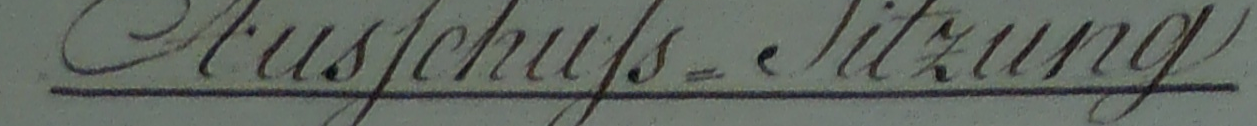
Ausschuss‗Sitzung
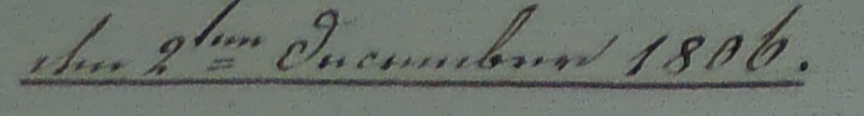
den 2te͇n Dezember 1806.
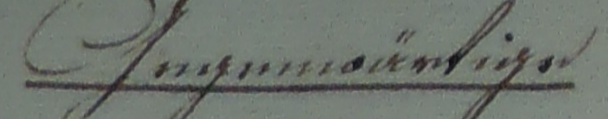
Gegenwärtige
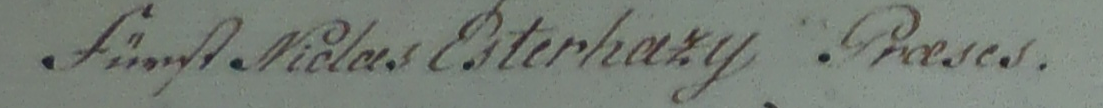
Fürst Niclas Esterhazy Præses.
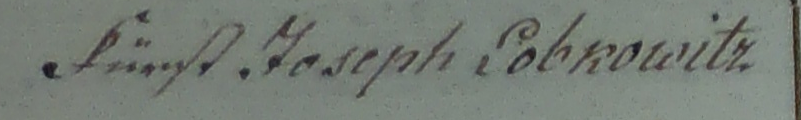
Fürst Joseph Lobkowitz
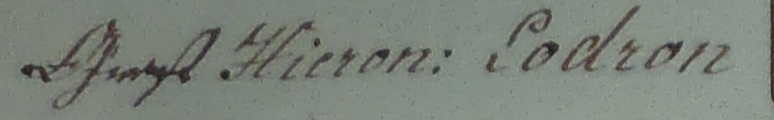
Graf Hieron: Lodron
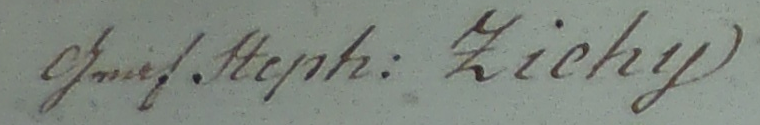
Graf Steph: Zichy
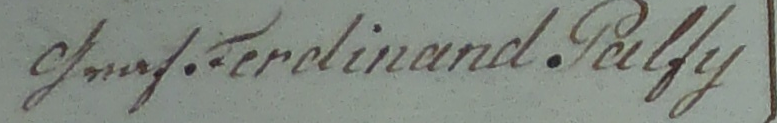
Graf Ferdinand Palfy
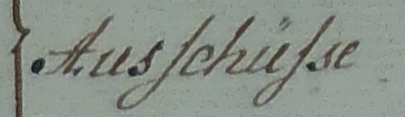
Ausschüsse
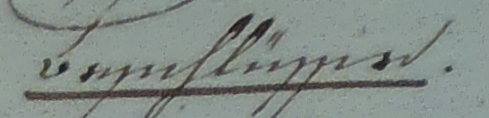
Beschlüsse.
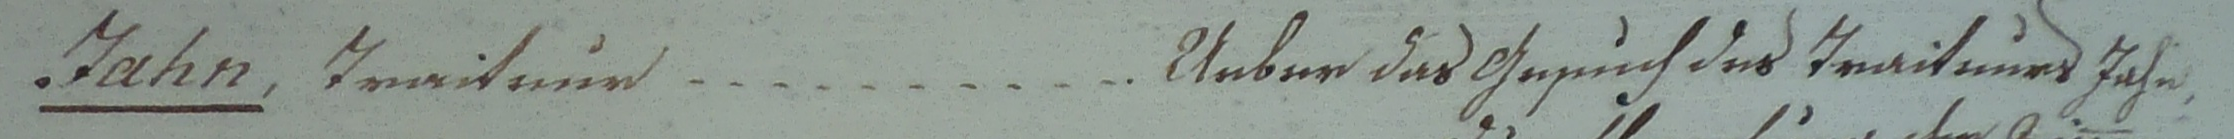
Jahn, Traiteur ……….. Ueber das Gesuch des Traiteurs Jahn,
